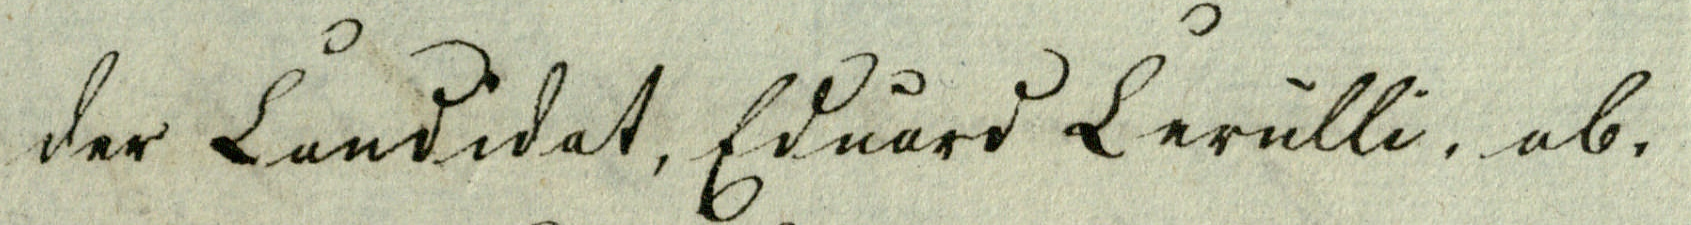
der Candidat, Eduard Cerulli, ab¬
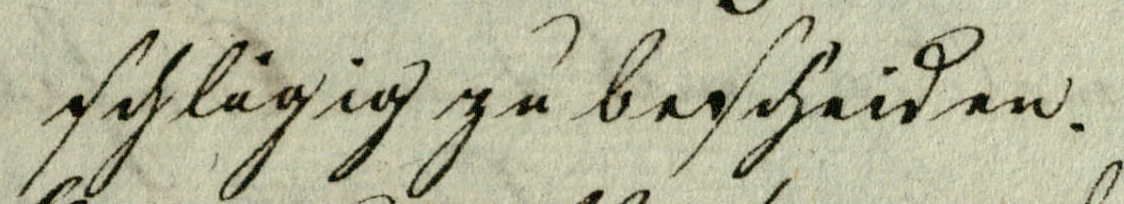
schlägig zu bescheiden.
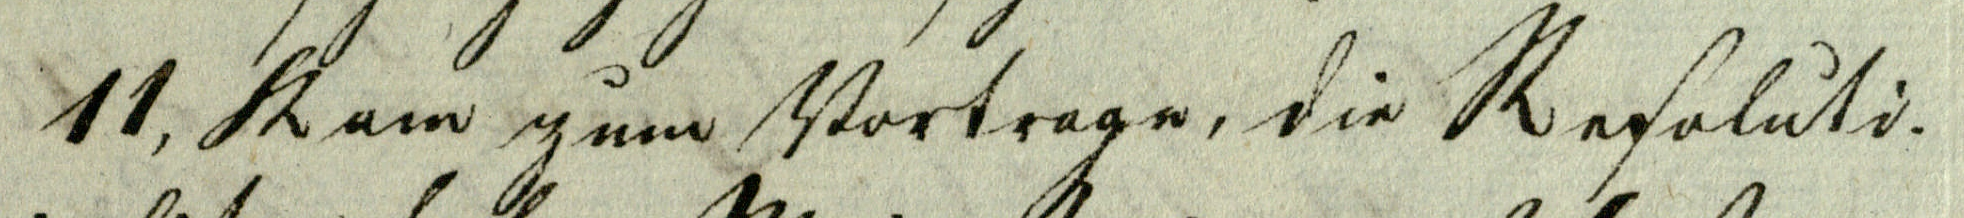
11, Kam zum Vortrage, die Resoluti¬
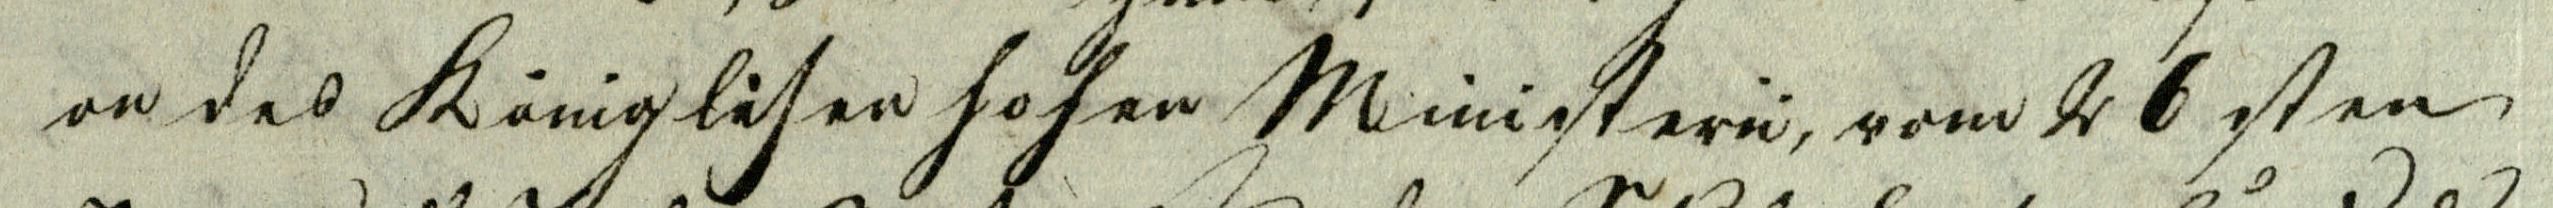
on des Königlichen hohen Ministerii, vom 26sten
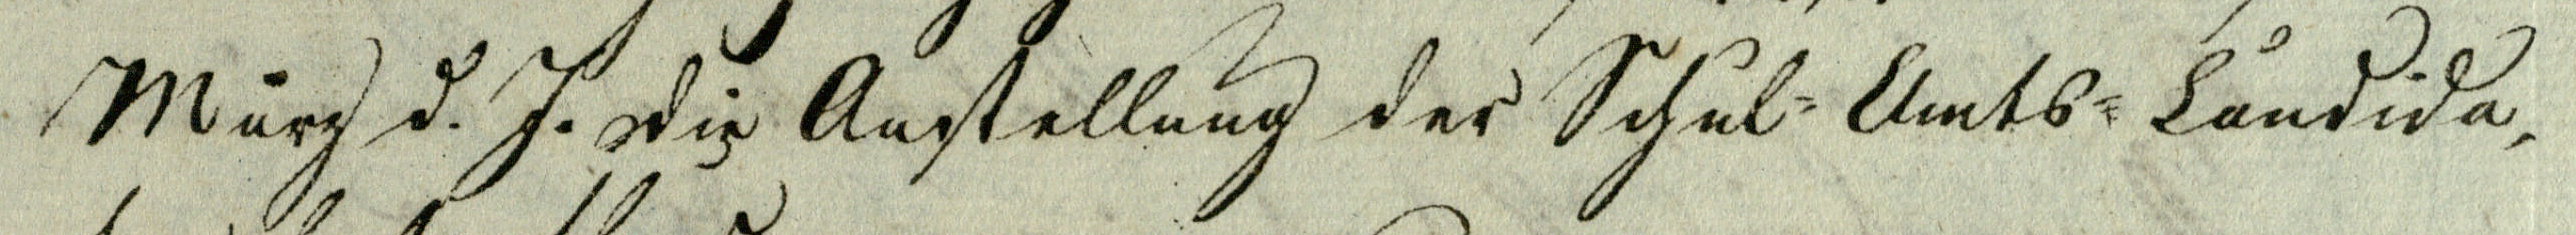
März d. J. die Anstellung der Schul-Amts-Candida¬
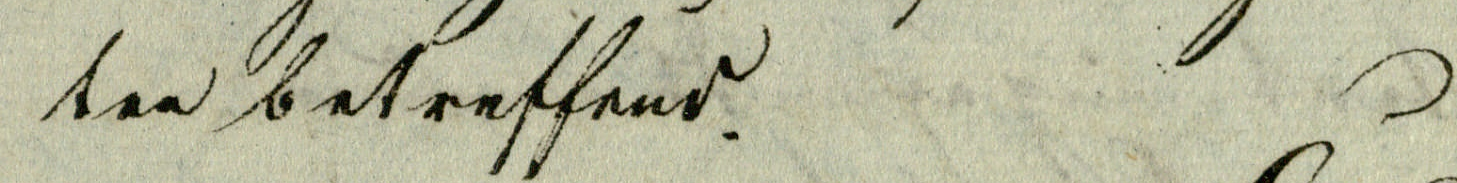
ten betreffend.
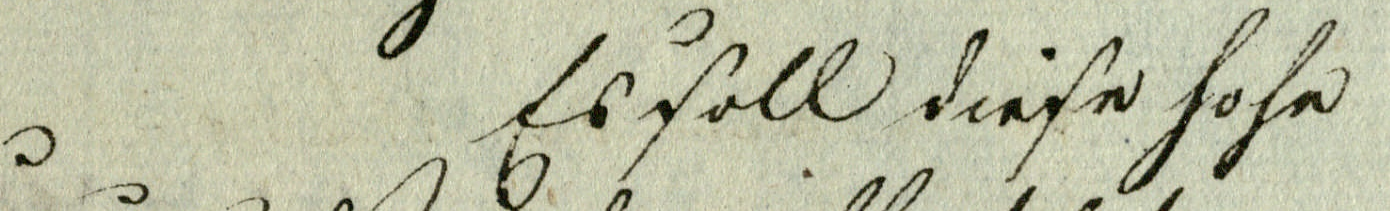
Es soll diese hohe
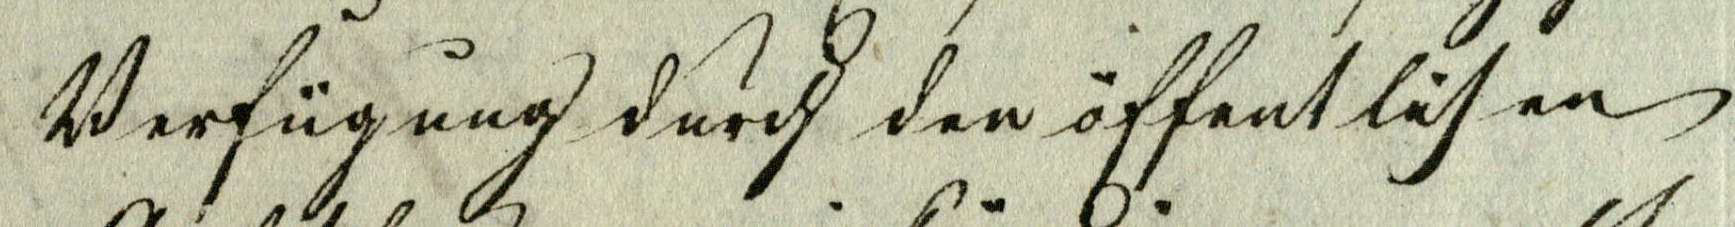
Verfügung durch den öffentlichen
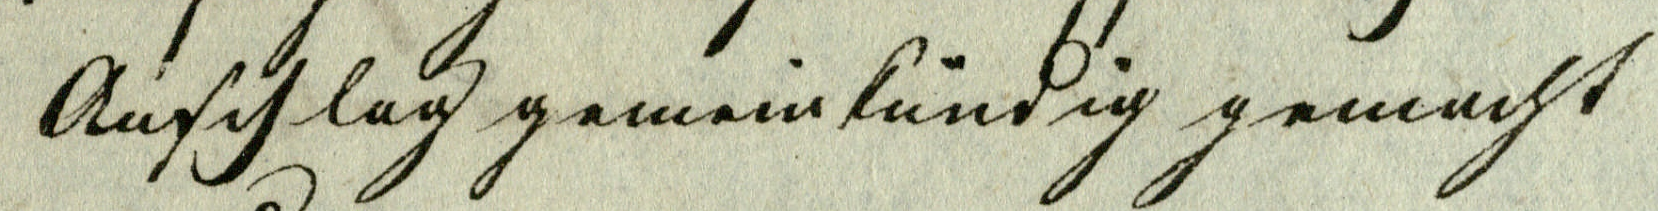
Anschlag gemeinkundig gemacht
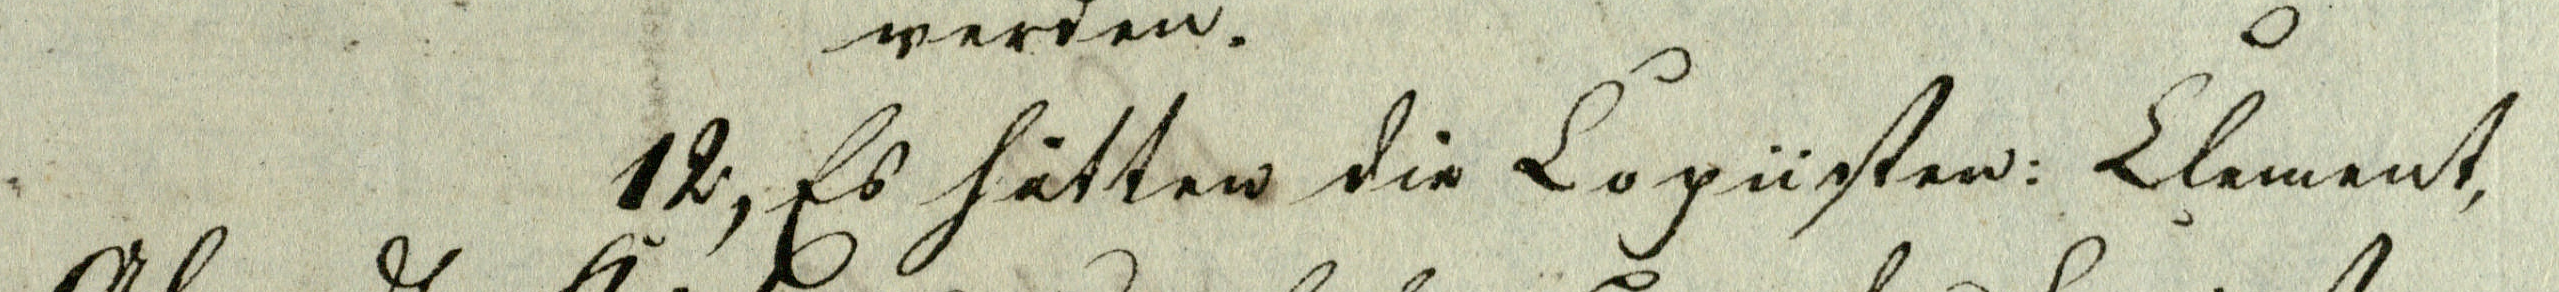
12, Es hätten die Copiisten: Clement,
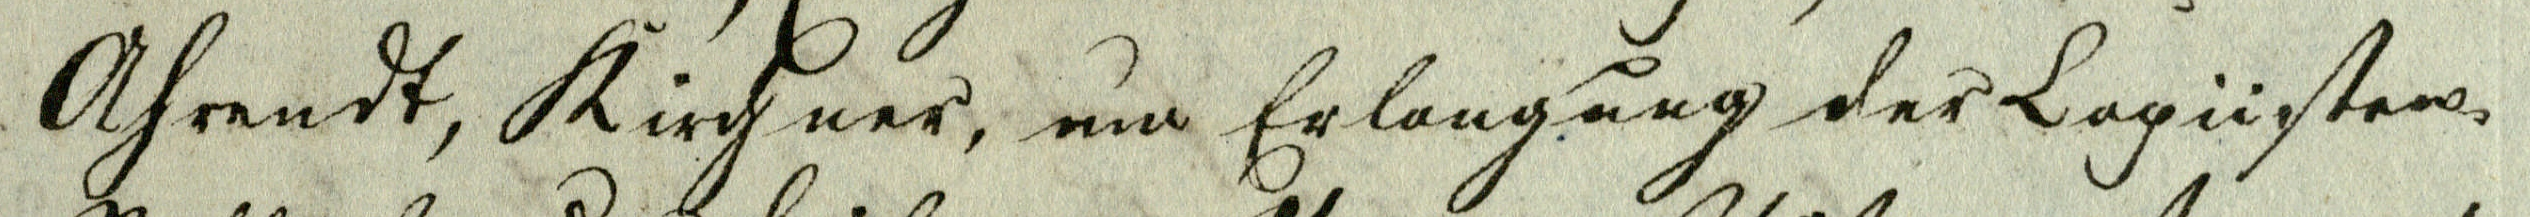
Ahrendt, Kirchner, um Erlangung der Copiisten¬
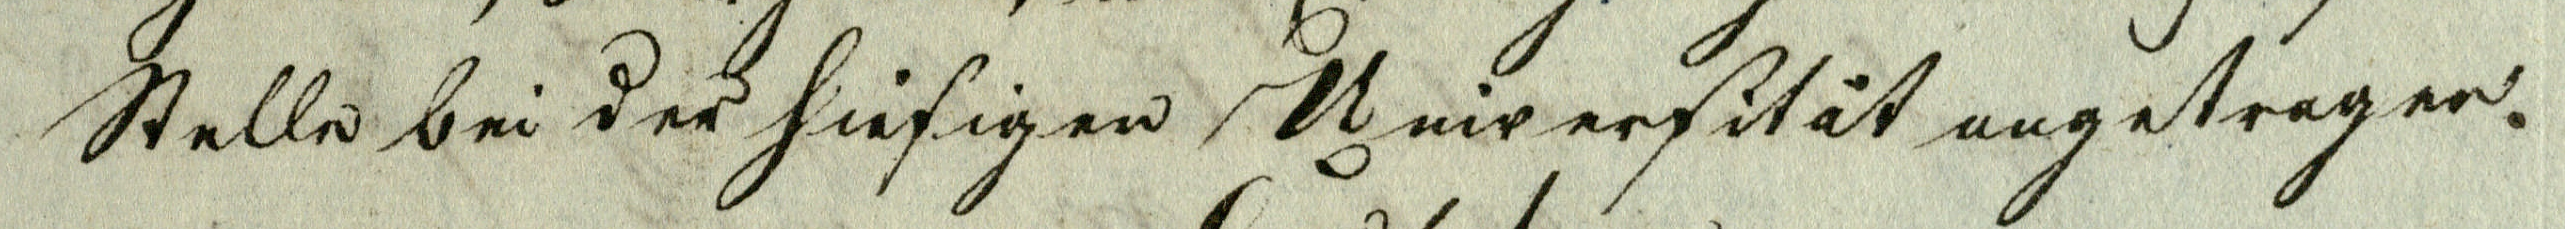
Stelle bei der hiesigen Universität angetragen.
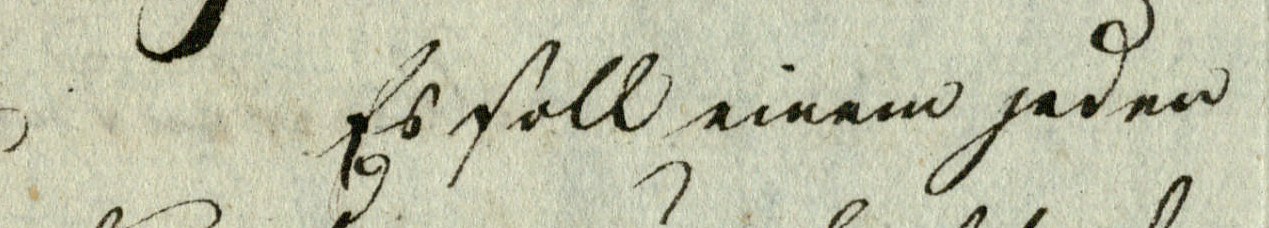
Es soll einem jeden
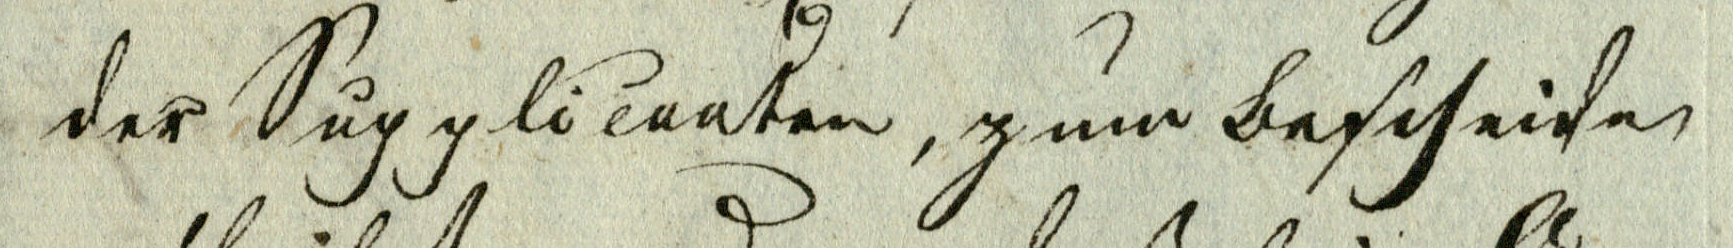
der Supplicanten, zum Bescheide
